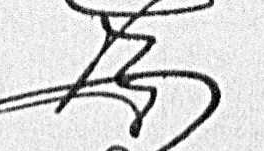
Xx
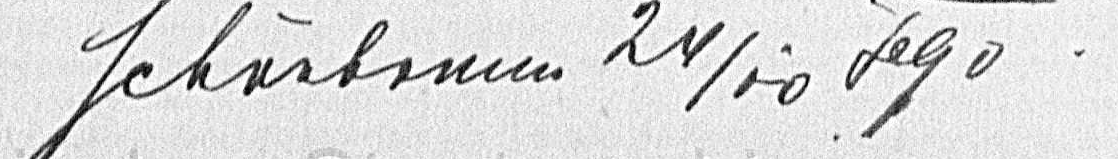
Schönbrunn 24/10 890.
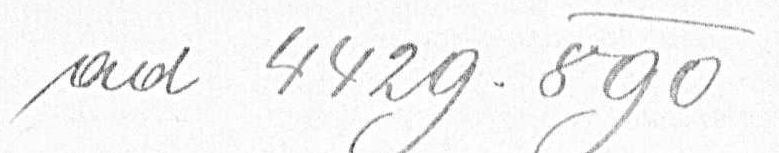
ad 4429. 890
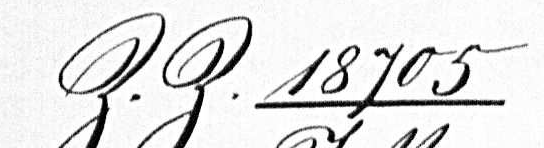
Z. Z.18705
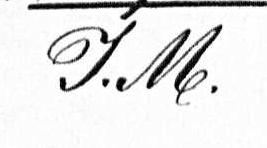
I. M.
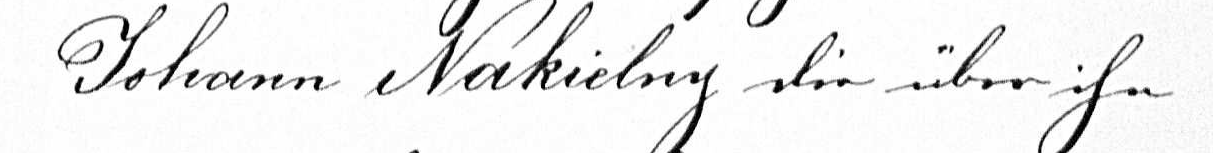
Johann Nakielny die über ihn
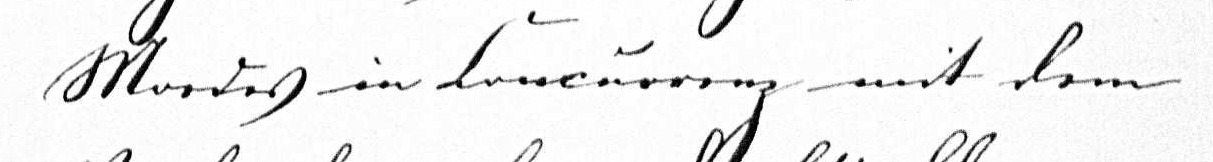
Mordes in Concurrenz mit dem
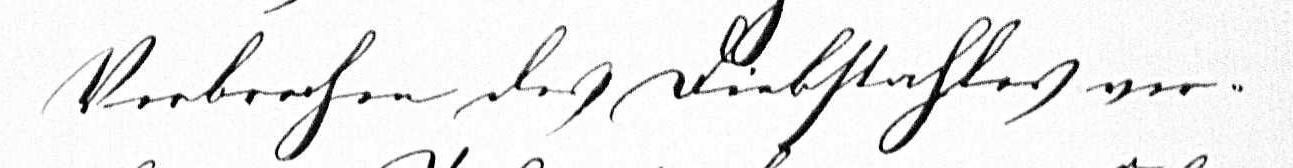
Verbrechen des Diebstahles ver¬
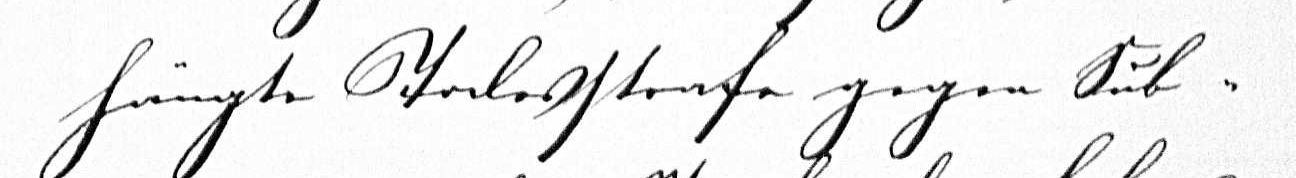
hängte Talesstrafe gegen Sub¬
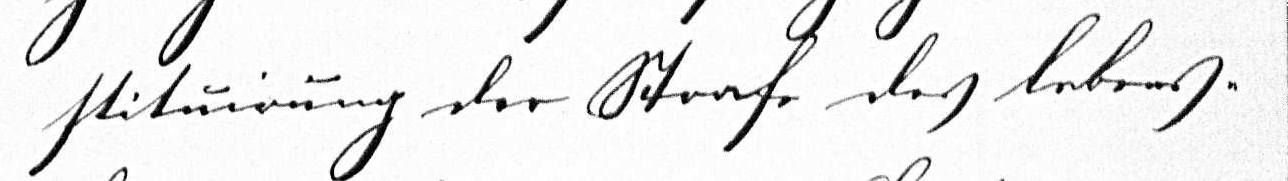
stituirung der Strafe des lebens¬
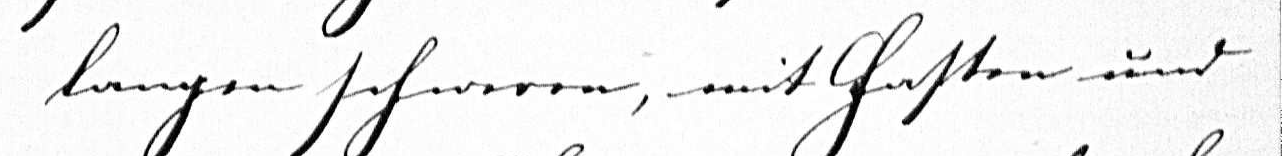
langen schweren, mit Fasten und
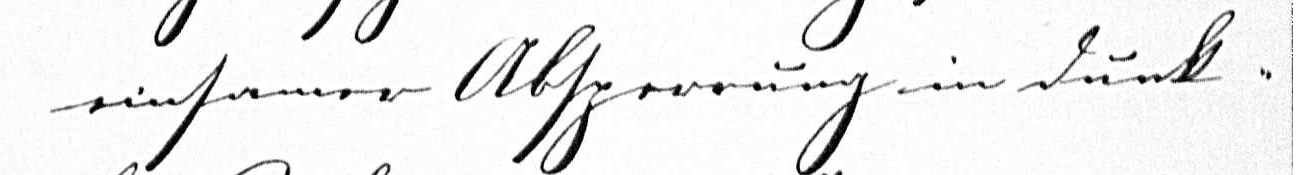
einsamer Absperrung in dunk¬
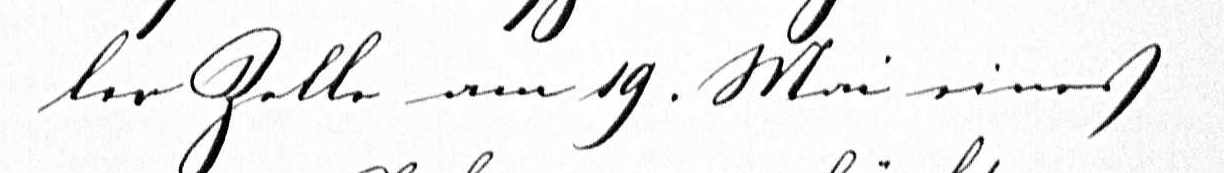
ler Zelle am 19. Mai eines
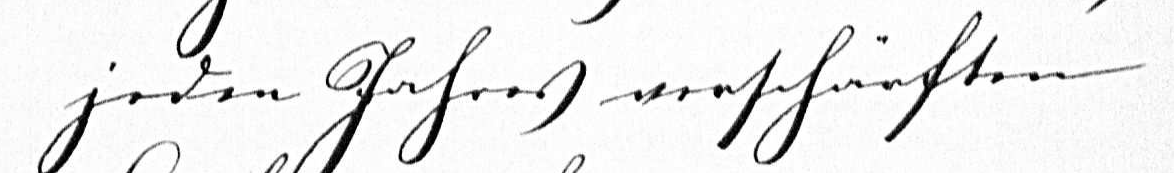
jeden Jahres verschärften
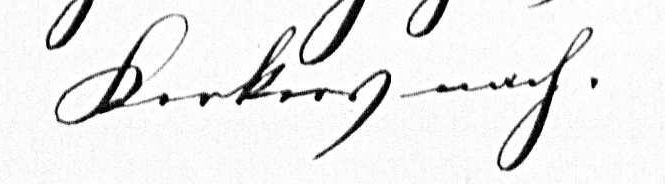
Kerkers nach.
